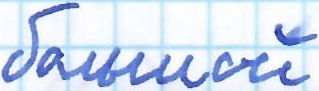большой
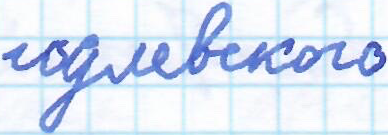годлевского
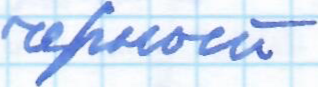черный
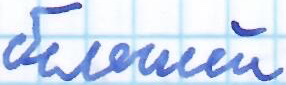белошей
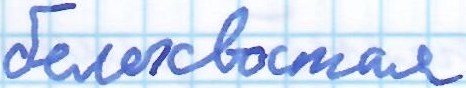белохвостая
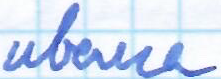иволга
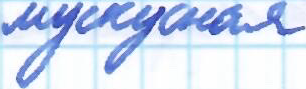мускусная
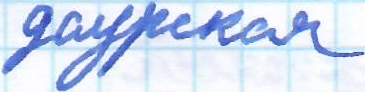даурская
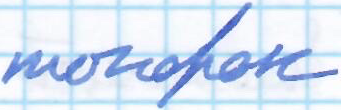топорок
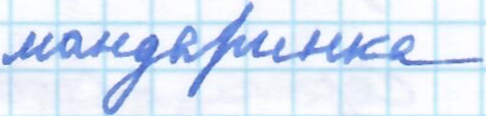мандаринка
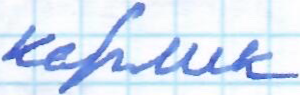карлик
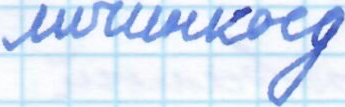личинкоед
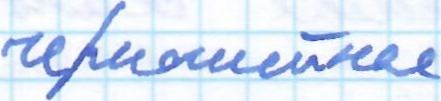черношейная
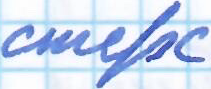стерх
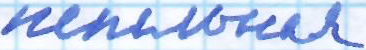пепельная
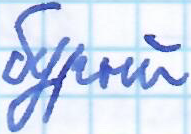бурый
